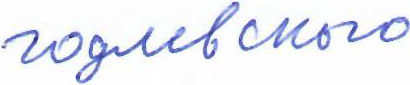годлевского
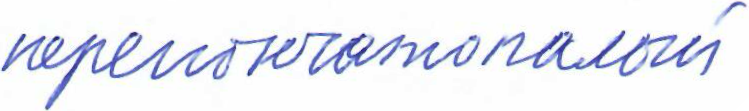перепончатопалый
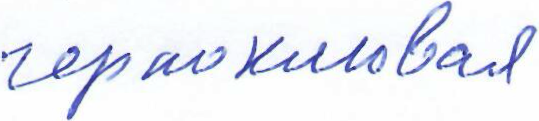черноклювая
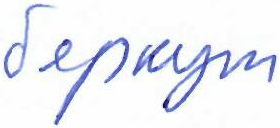беркут
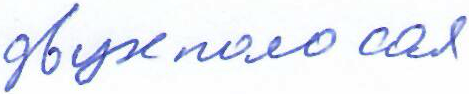двухполосая
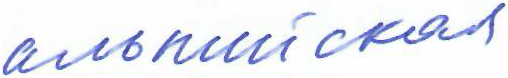альпийская
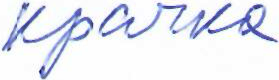крачка
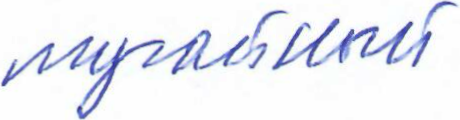тугайный
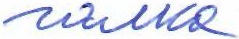галка
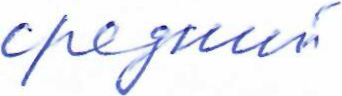средний
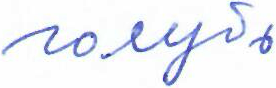голубь
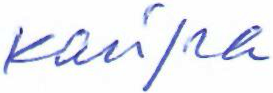кайра
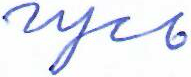гусь
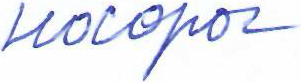носорог
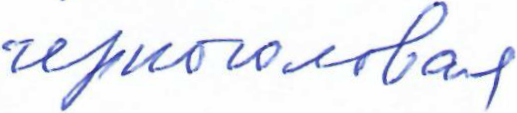черноголовая
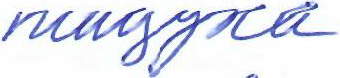пищуха
